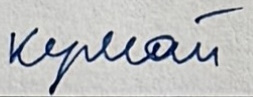кумай
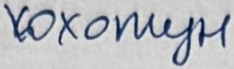хохотун
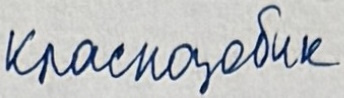краснозобик
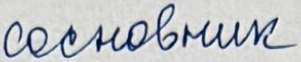сосновик
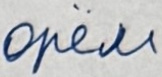орём
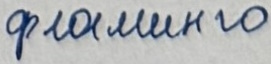фламинго
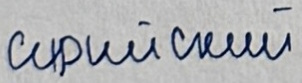сирийский
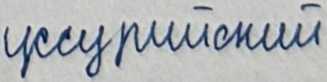уссурийский
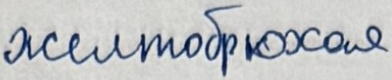желтобрюхая
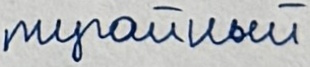тугайный
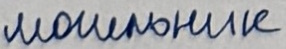могильник
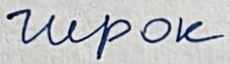чирок
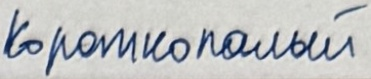короткопалый
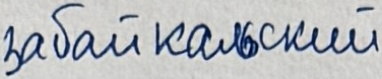забайкальский
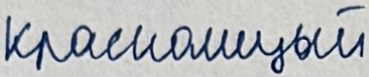краснолицый
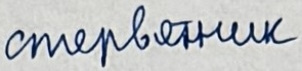стервятник
